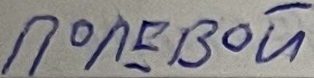полевой
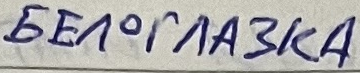белоглазка
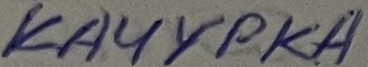качурка
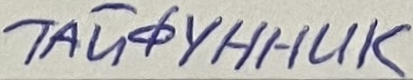тайфунник
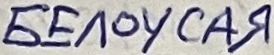белоусая
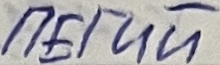пегий
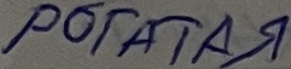рогатая
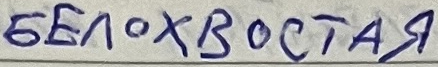белохвостая
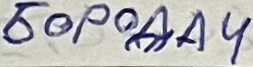бородач
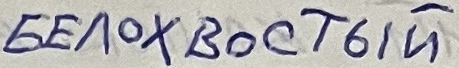белохвостый
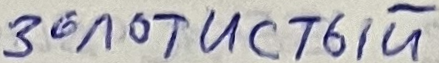золотистый
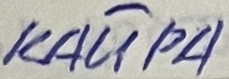кайра
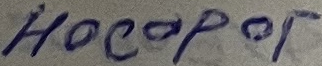носорог
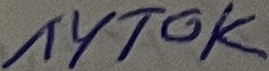луток
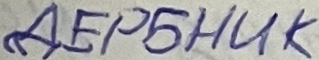дербник
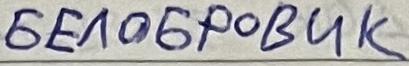белобровик
